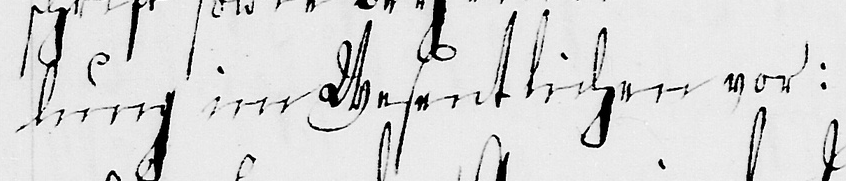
lung im Wesentlichen vor:
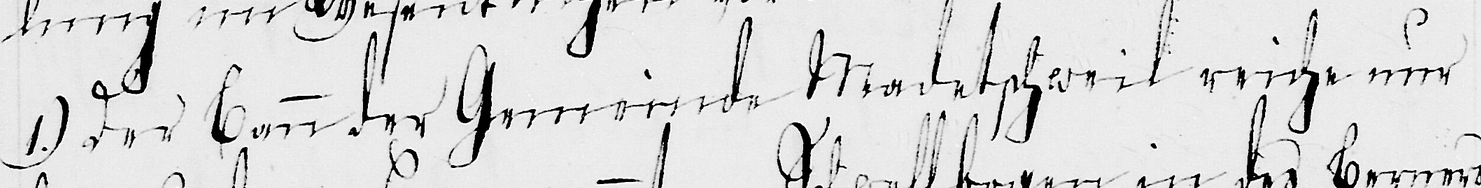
1.) Der Bann der Gemeinde Madetschweil reiche nur
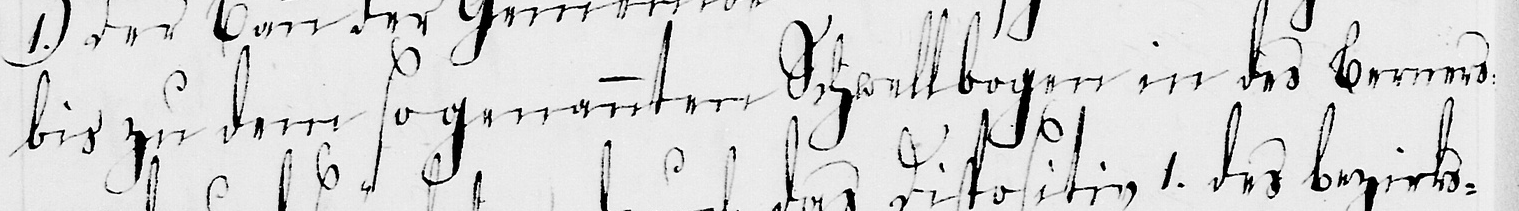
bis zu dem sogenannten Schwellbogen in des Berners¬
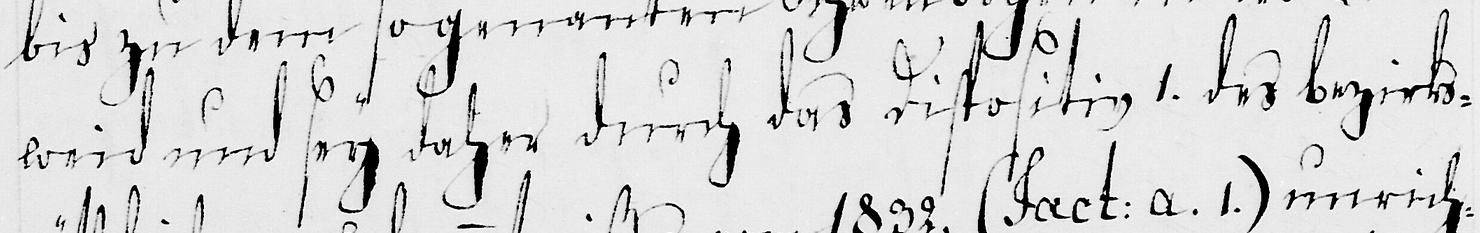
weid und sey daher durch das Dispositiv 1. des Bezirks¬
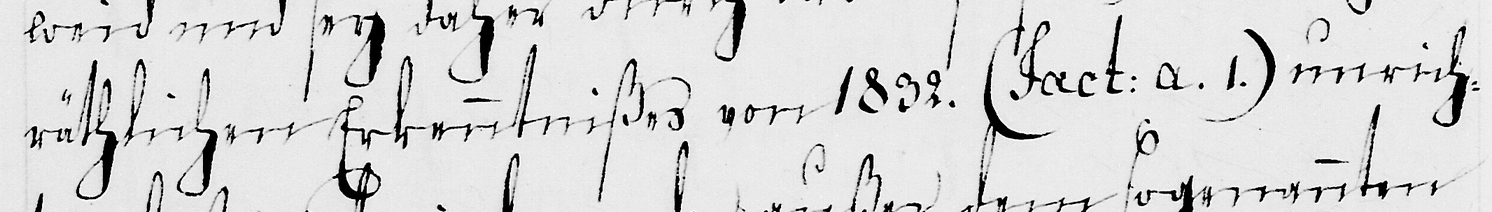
räthlichen Erkenntnißes von 1832. (Fact: a.1.) unrich¬
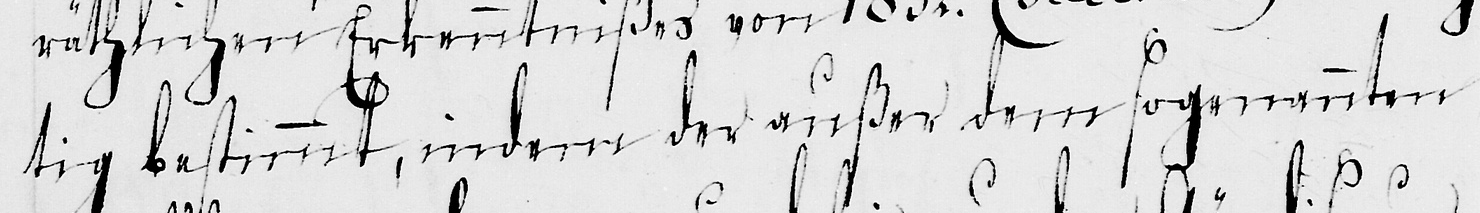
tig bestimmt, indem der außer dem sogenannten
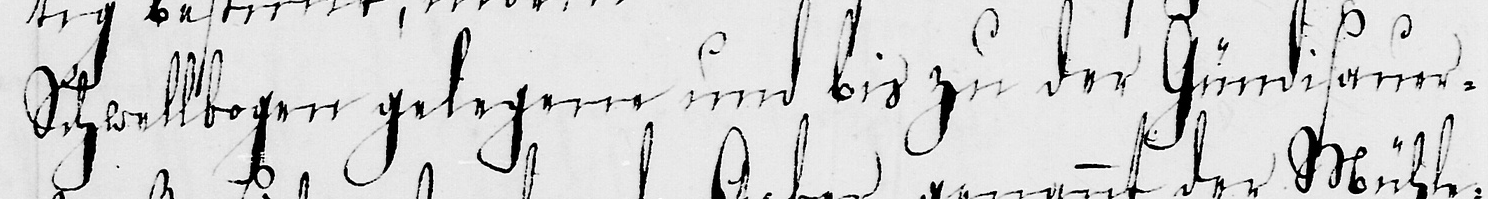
Schwellbogen gelegene und bis zu der Gündisauer¬
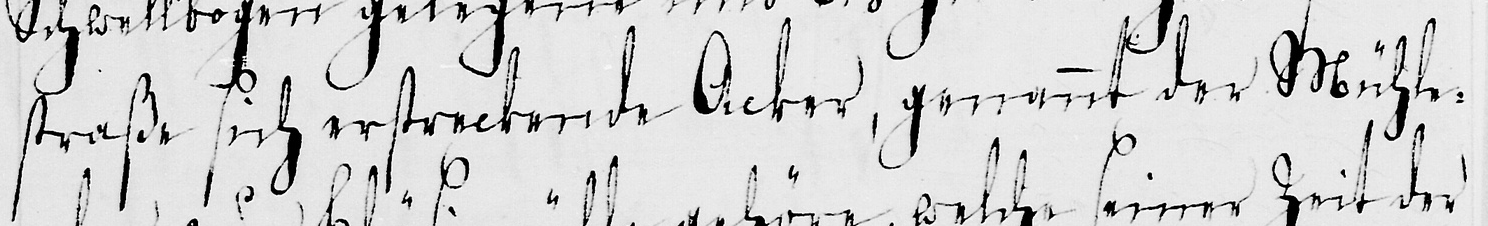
straße sich erstreckende Acker, genannt der Mühle¬
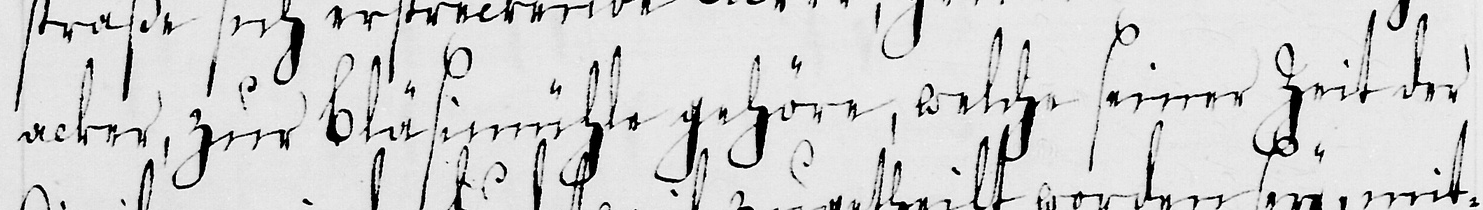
acker, zur Bläsimühle gehöre, welche seiner Zeit der
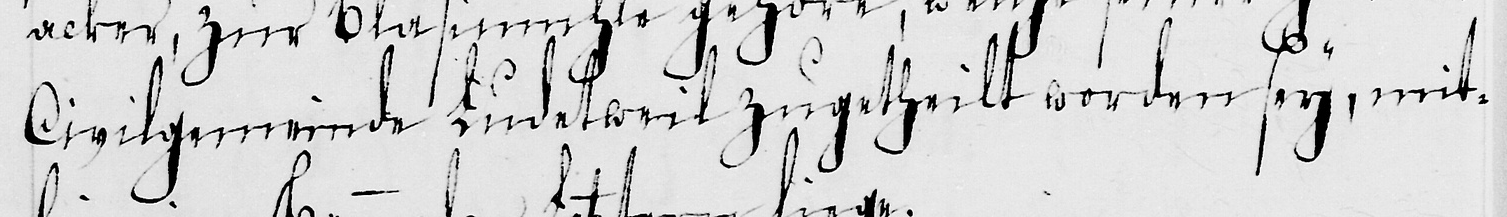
Civilgemeinde Ludetschweil zugetheilt worden sey, mit¬
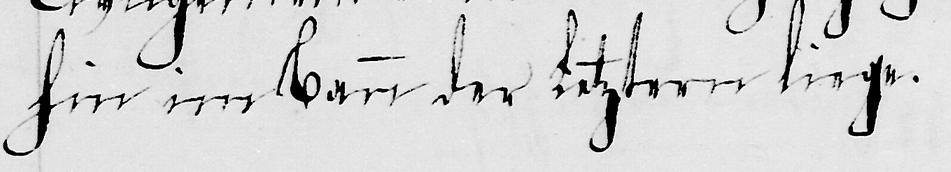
hin im Bann der Letztern liege.
